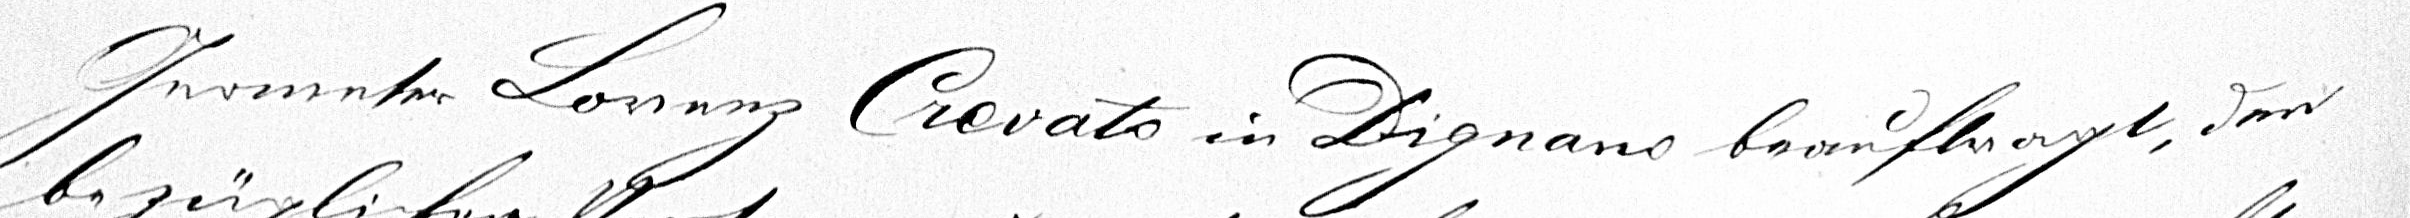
Geometer Lorenz Crevato in Dignano beauftragt, den
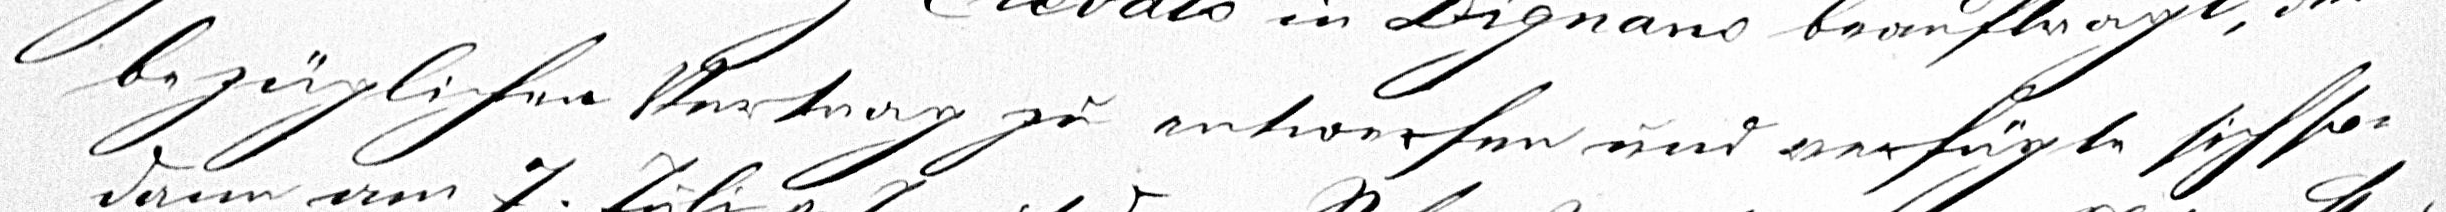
bezüglichen Vertrag zu entwerfen und verfügte sich so¬
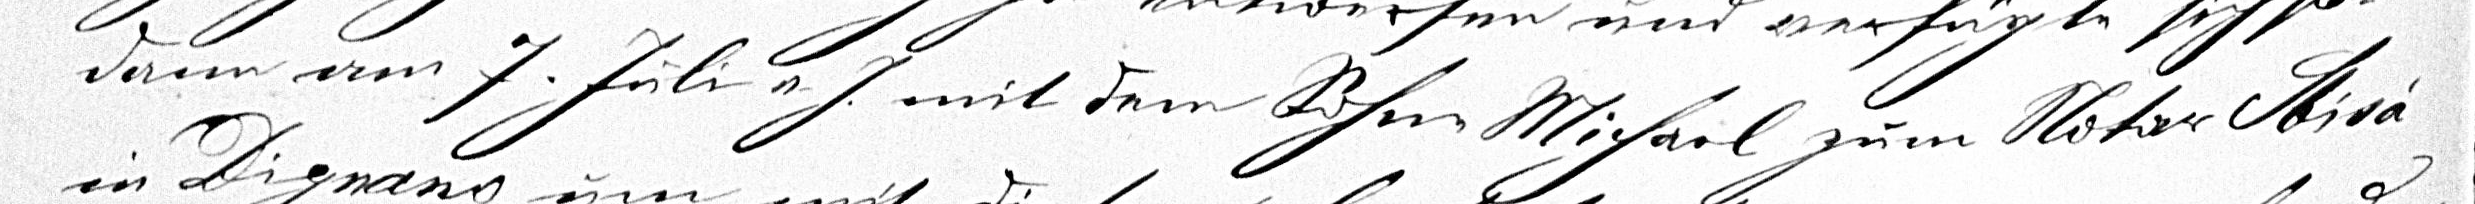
dann am 7. Juli v. J. mit dem Sohne Michael zum Notar Sbisá
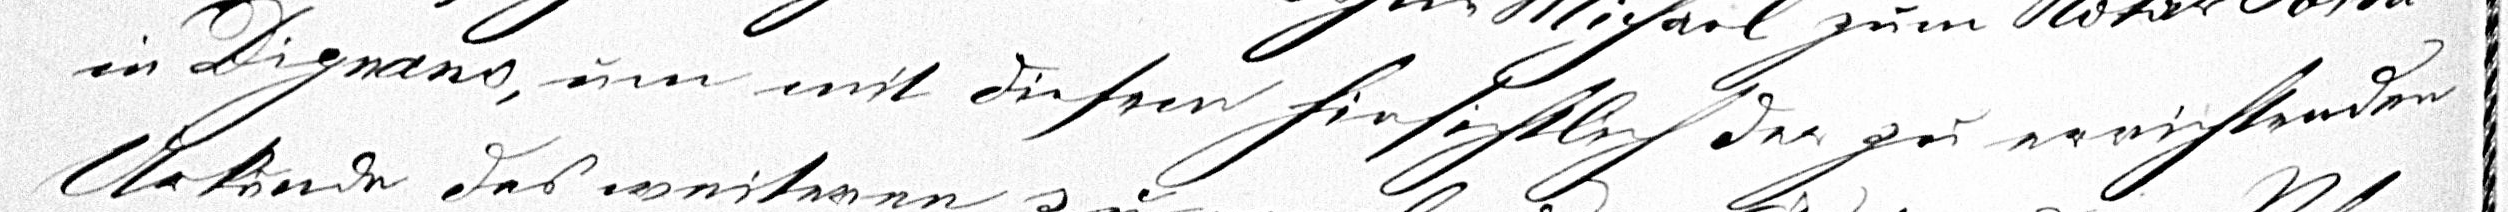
in Dignano, um mit diesem hinsichtlich der zu errichtenden
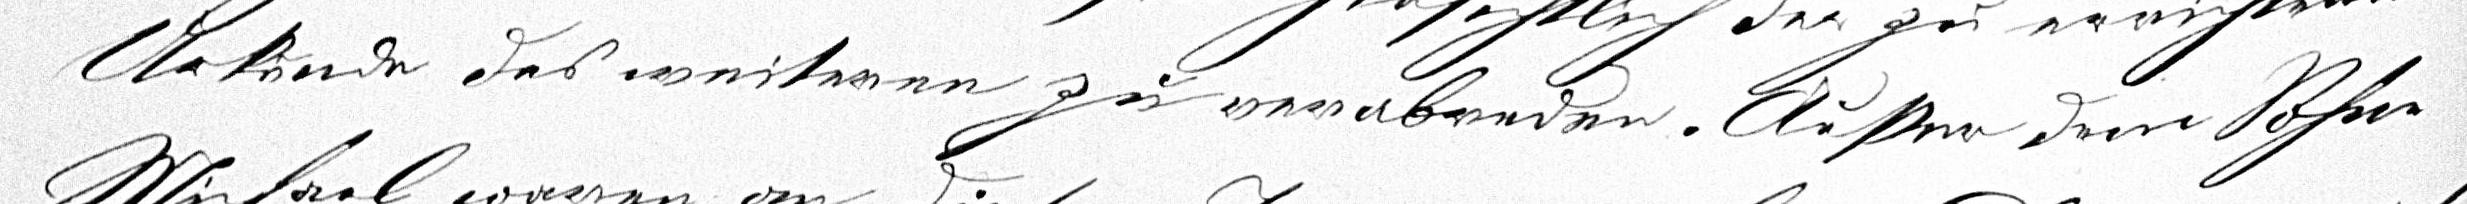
Urkunde des weiteren zu verabreden. Außer dem Sohne
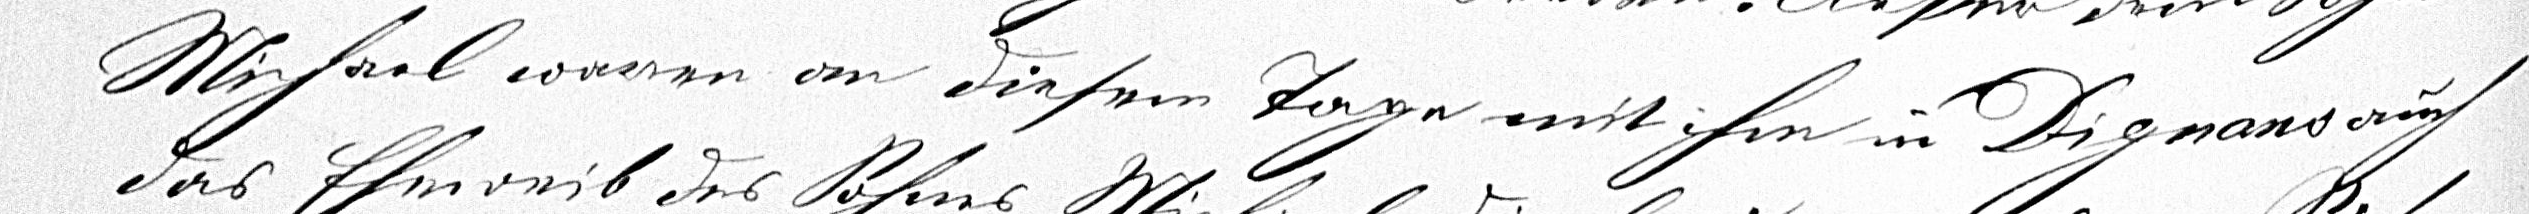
Michael waren an diesem Tage mit ihm in Dignano auf
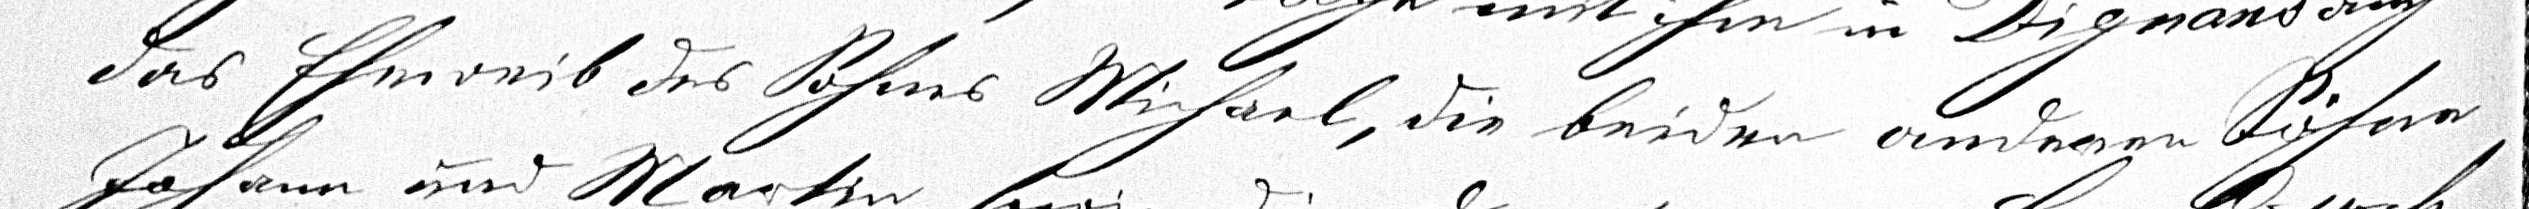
das Eheweib des Sohnes Michael, die beiden anderen Söhne
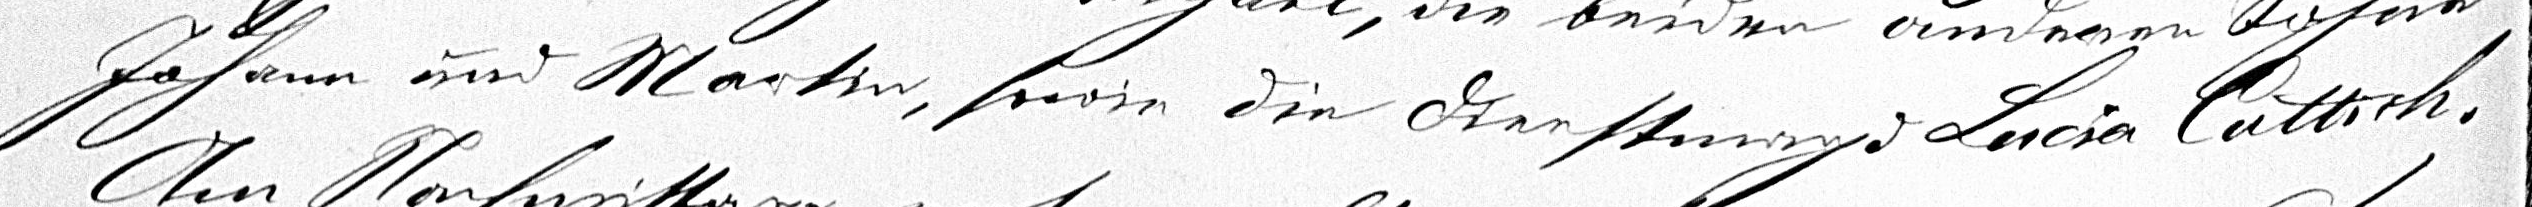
Johann und Martin, sowie die Dienstmagd Lucia Calcich.
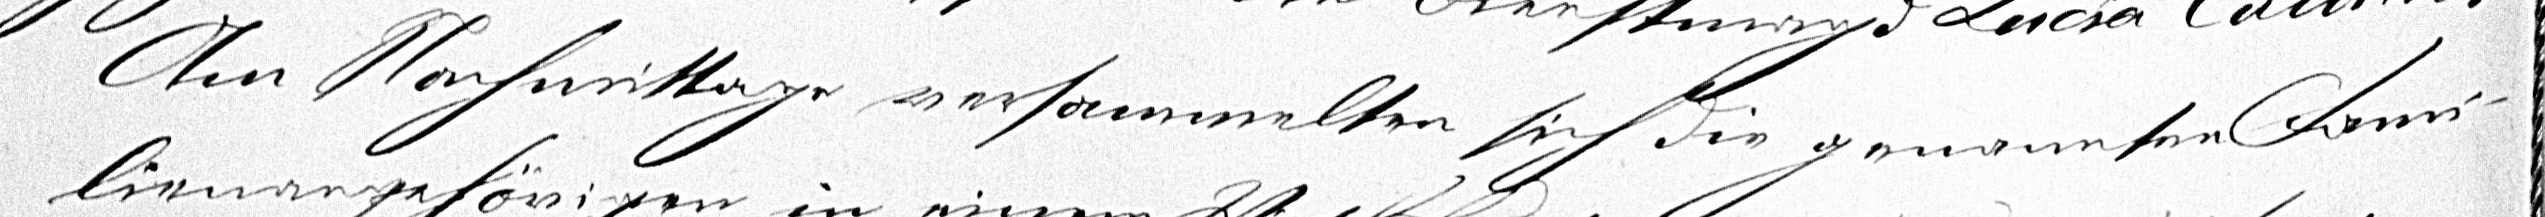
Am Nachmittage versammelten sich die genannten Fami¬
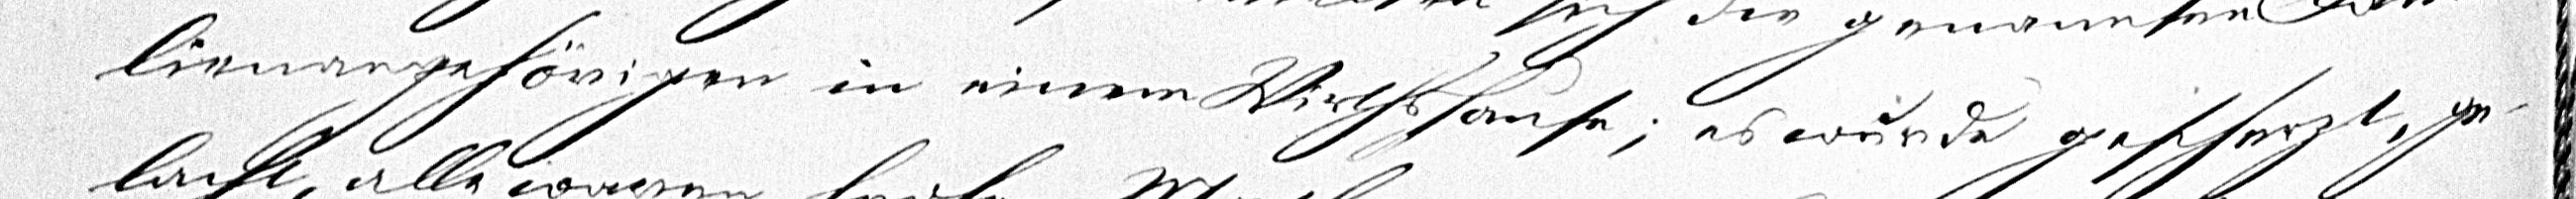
lienangehörigen in einem Wirthshause; es wurde gescherzt, ge¬
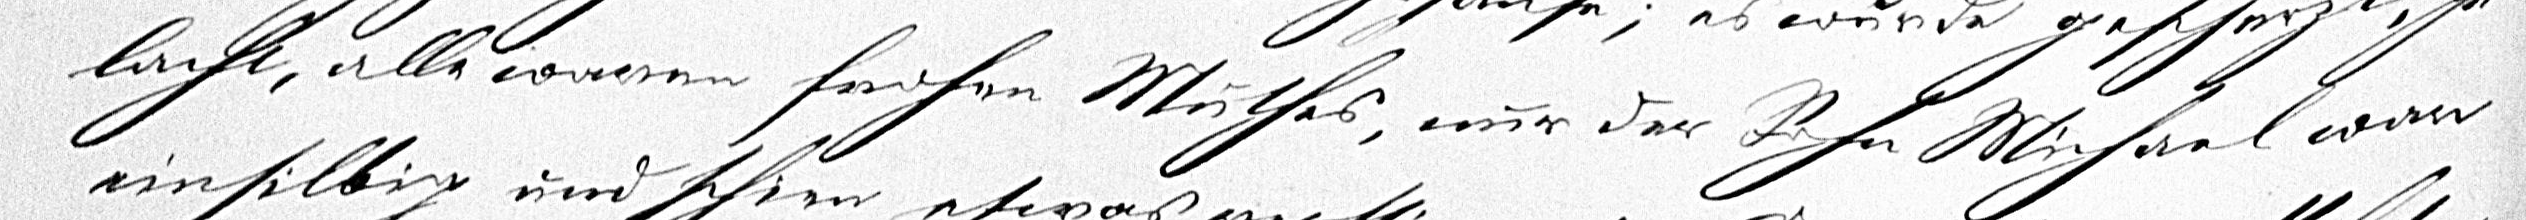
lacht, alle waren frohen Mathes, nur der Sohn Michael war
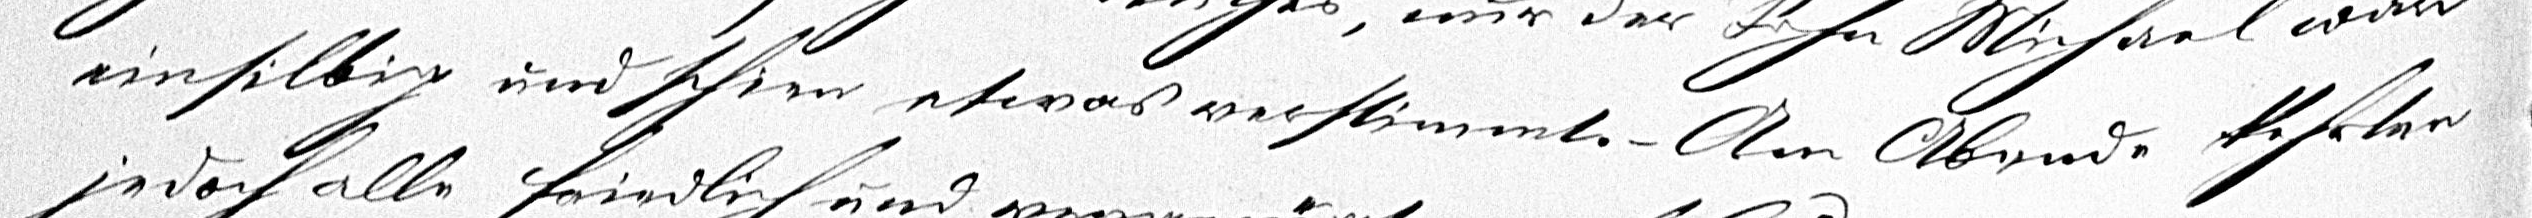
einsilbig und schien etwas verstimmte.- Am Abrede kehrten
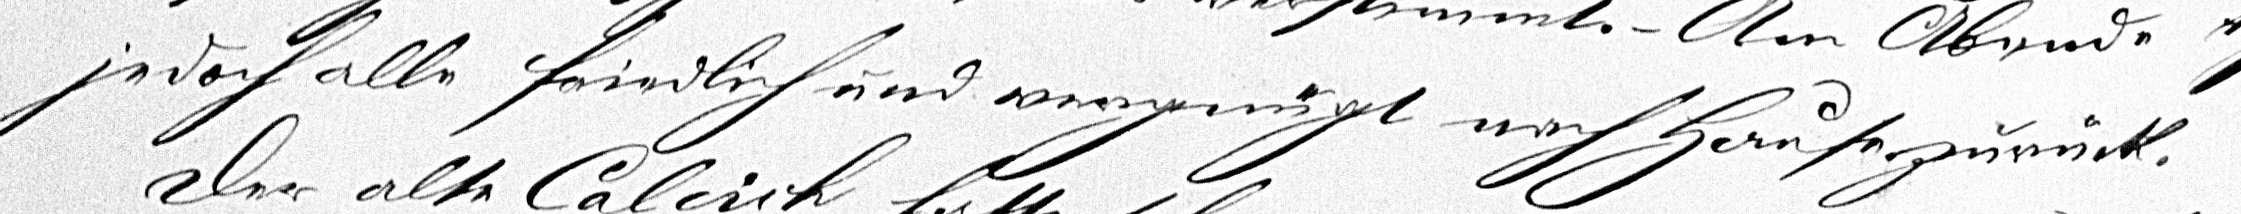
jedoch alle friedlich und vergnügt nach Hause zurück.
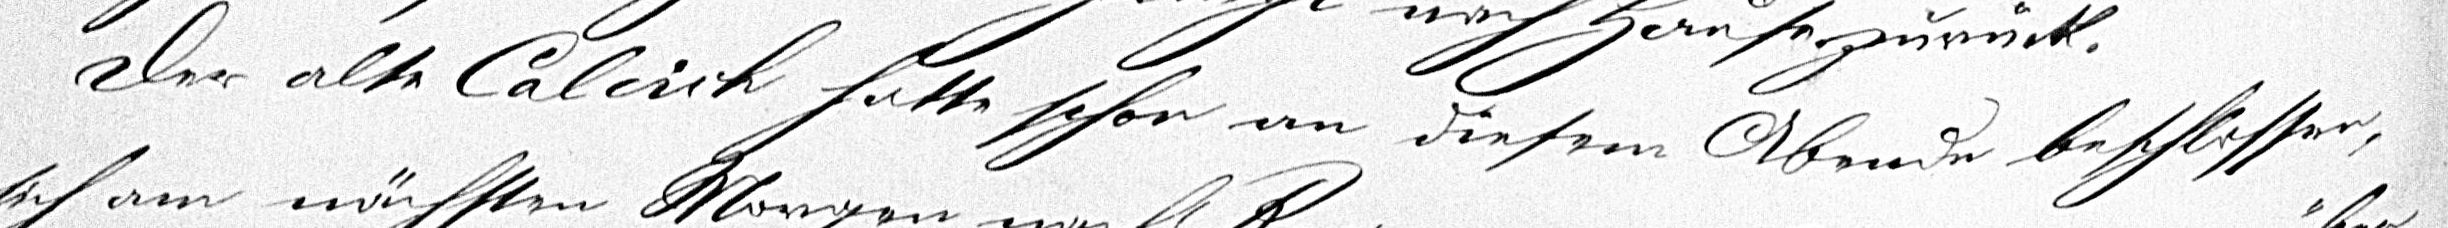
Der alle Calcich hatte schon an diesem Abende beschlossen,
